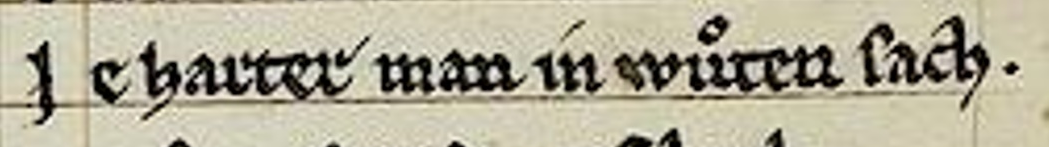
Ie harter man in wu°oten ſach.
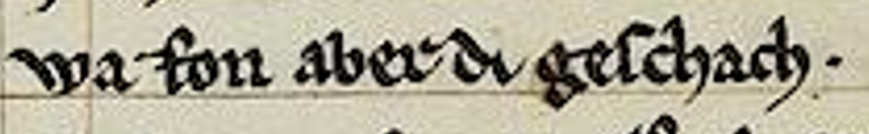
Wa fon aber d(az) geſchach.
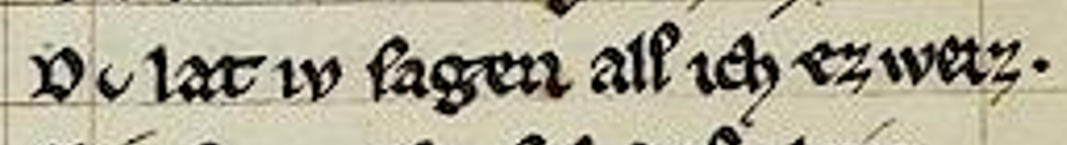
D(az) lat iv ſagen alſ ich ez weiz.
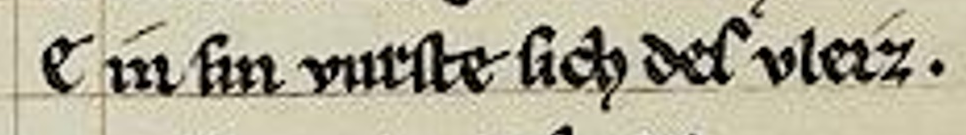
Ein ſin vurſte ſich deſ vleiz.
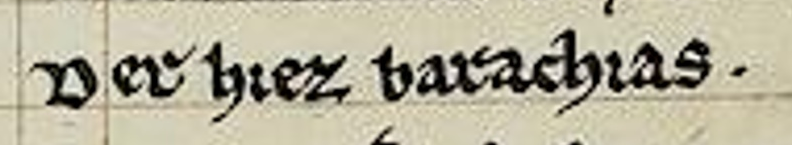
Der hiez barachias.
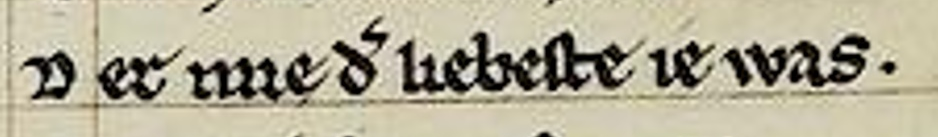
Der ime d(er) liebeſte ie was.
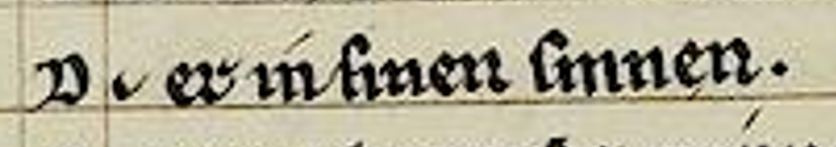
D(az) er in ſinen ſinnen.
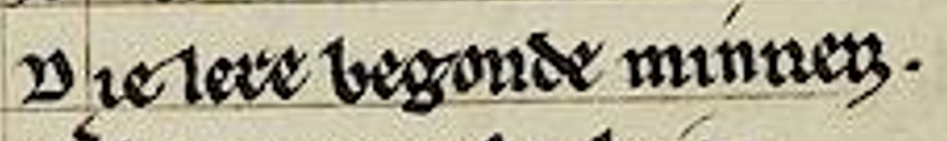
Die lere begonde minnen.
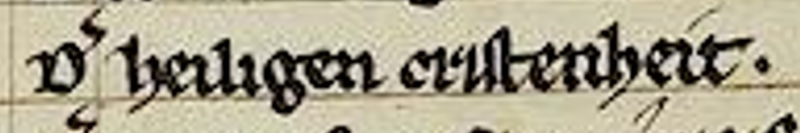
D(er) heiligen criſtenheit.
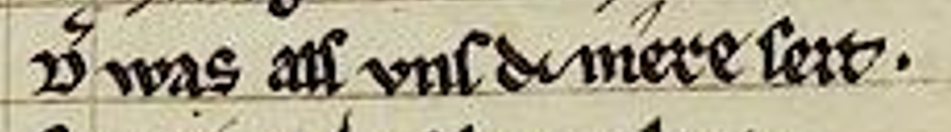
D(er) was alſ vnſ d(az) mere ſeit.
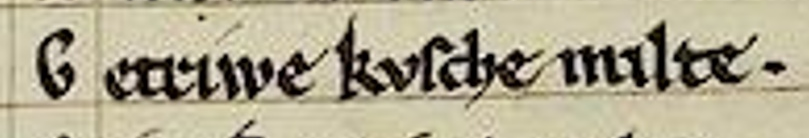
Getriwe kvſche milte.
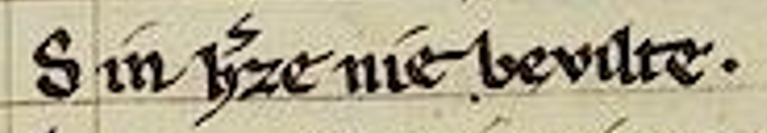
Sin h(er)ze nie bevilte.
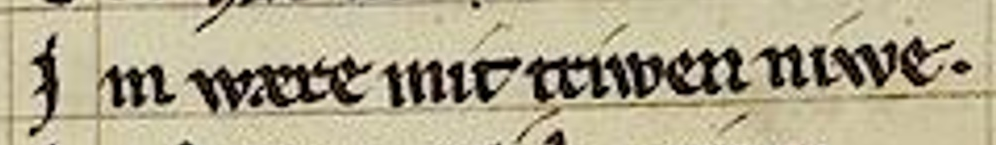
Im w[ae]re mit triwen niwe.
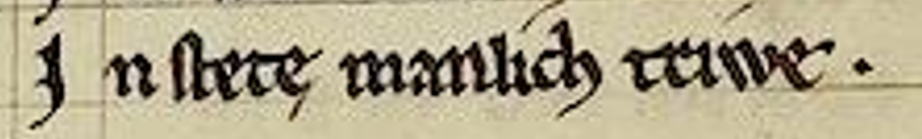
In ſtete manlich triwe.
